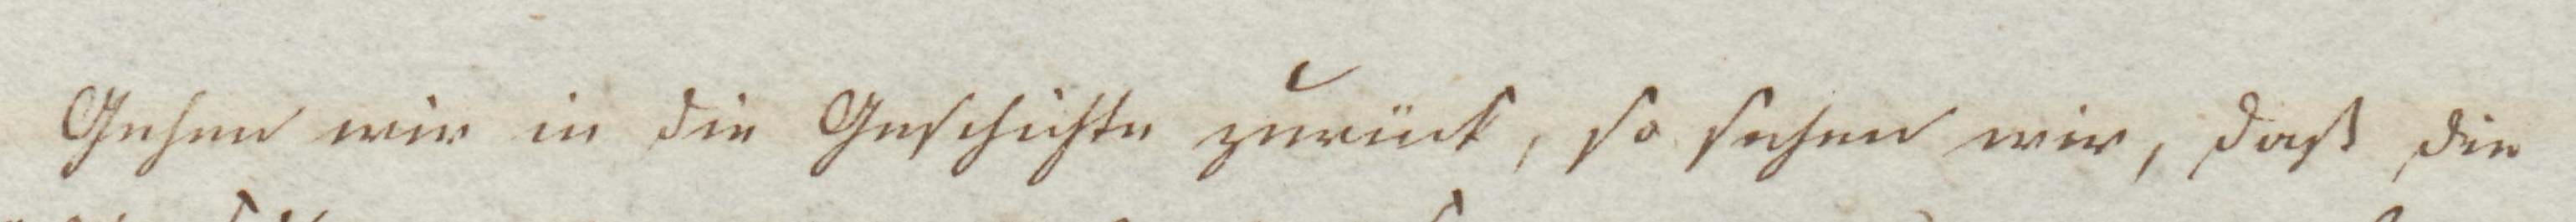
Gehen wir in die Geschichte zurück, so sehen wir, daß die
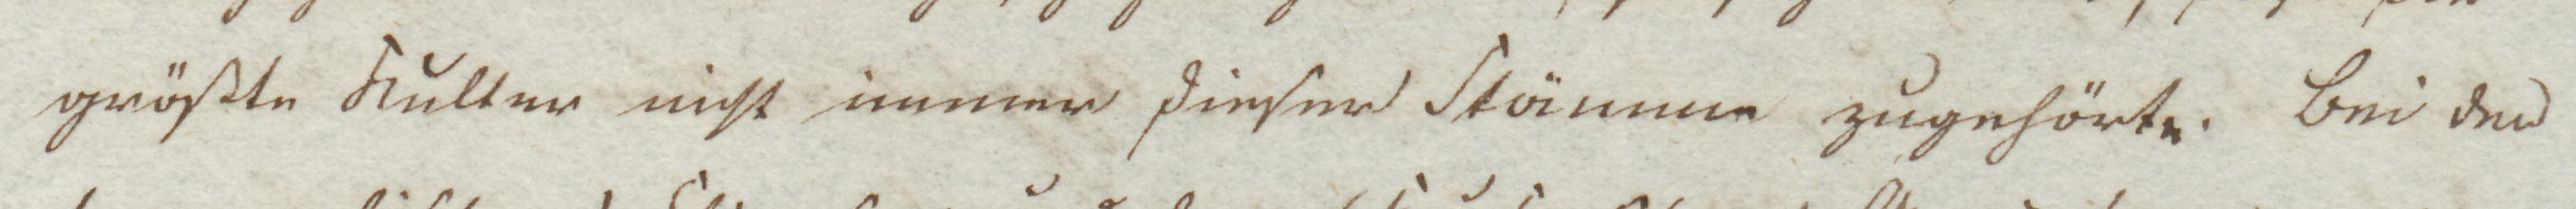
größte Kultur nicht immer zugehörte. Bei den
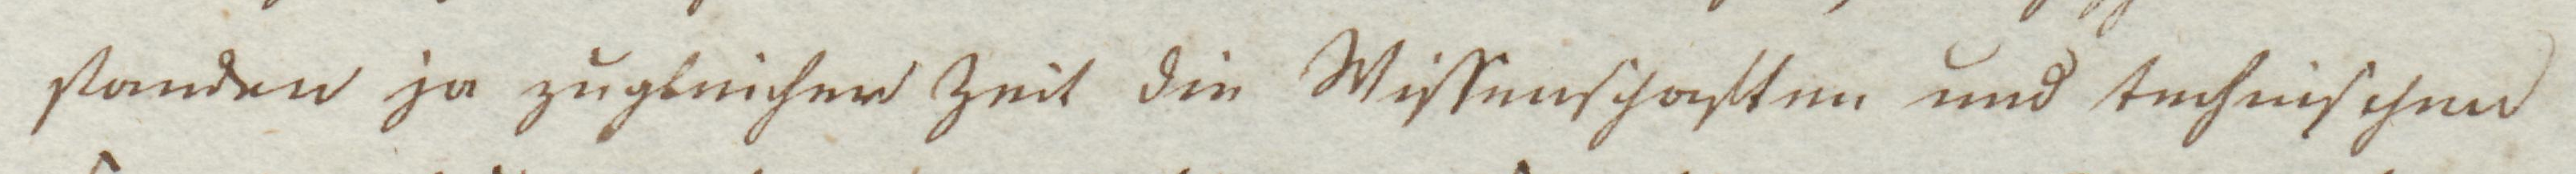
standen ja zu gleicher Zeit die Wissenschaften und technischen
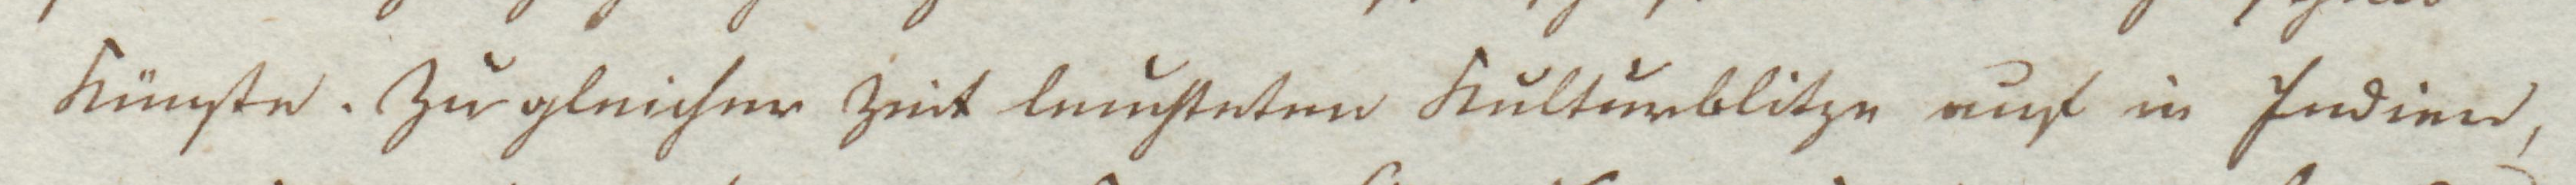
Künste. Zu gleicher Zeit leuchteten Kulturblitze auf in Indien,
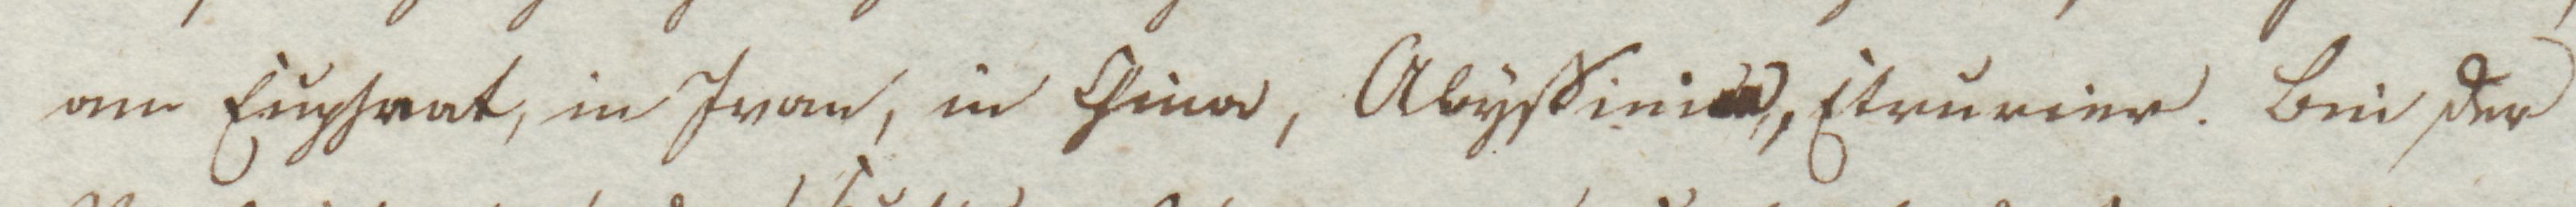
am Euphrat, in Iran, in China, Abÿßssinien, . Bei der
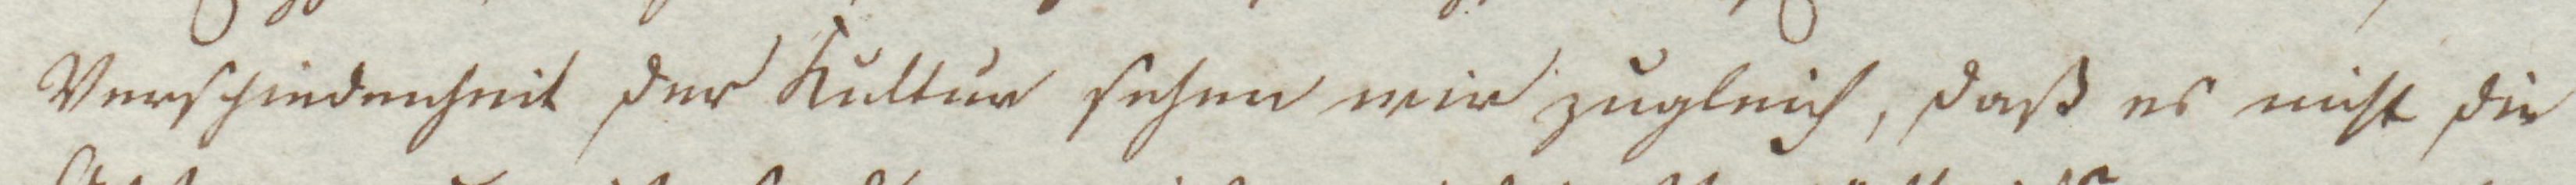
Verschiedenheit der Kultur sehen wir zugleich, daß es nicht die
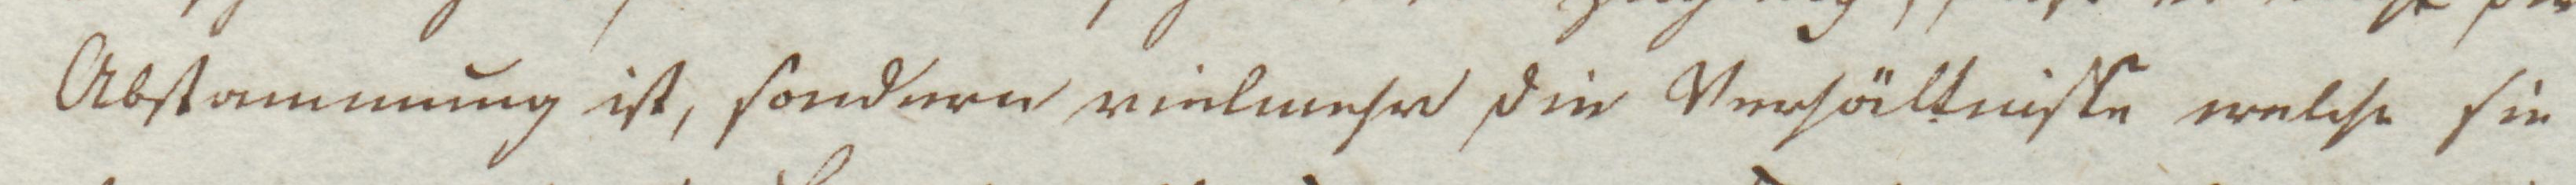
Abstammung ist, sondern vielmehr die Verhältnisse welche sie
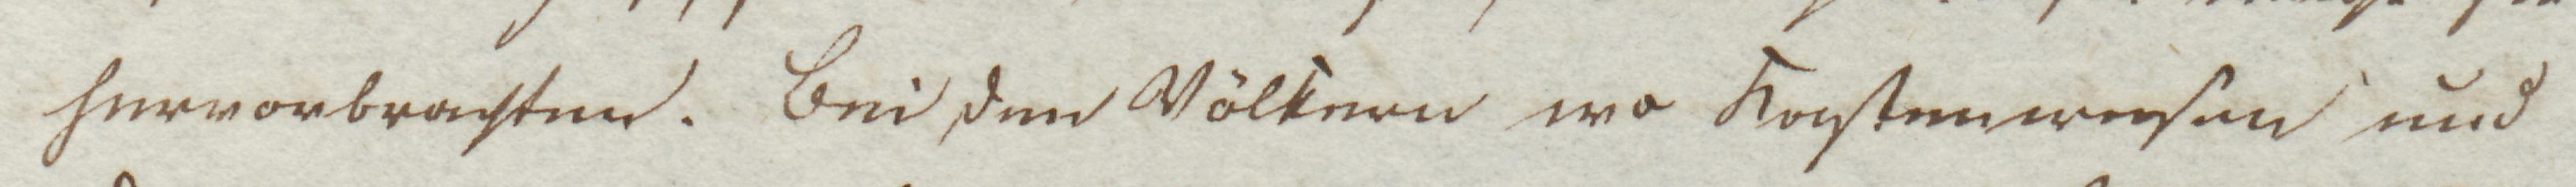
hervorbrachten. Bei den Völkern wo Kastenwesen und
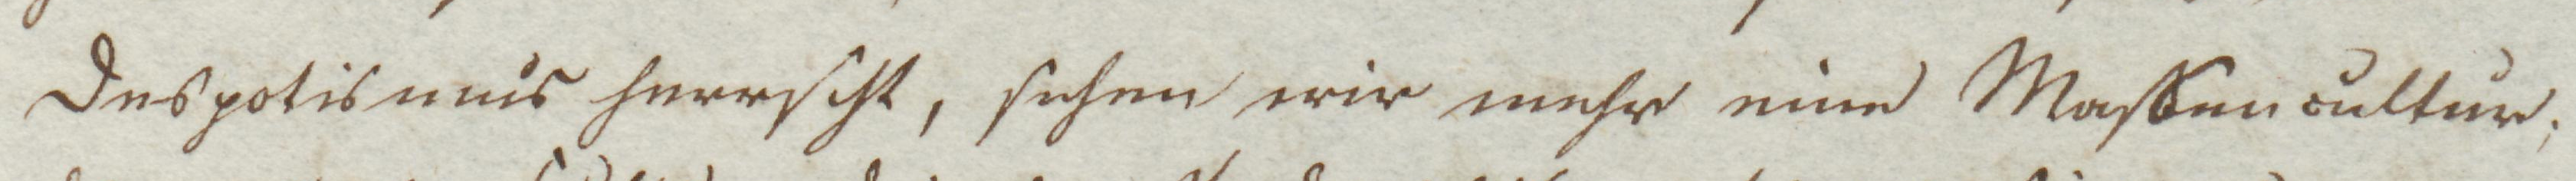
Despotismus herrscht, sehen wir mehr eine Maßssencultur;
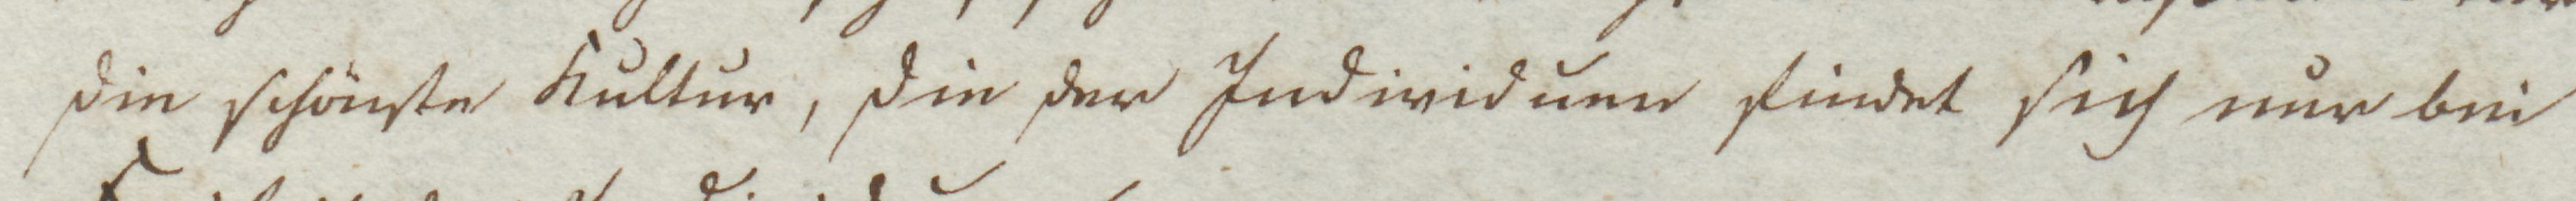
die schönste Kultur, die der Individuen findet sich nur bei
